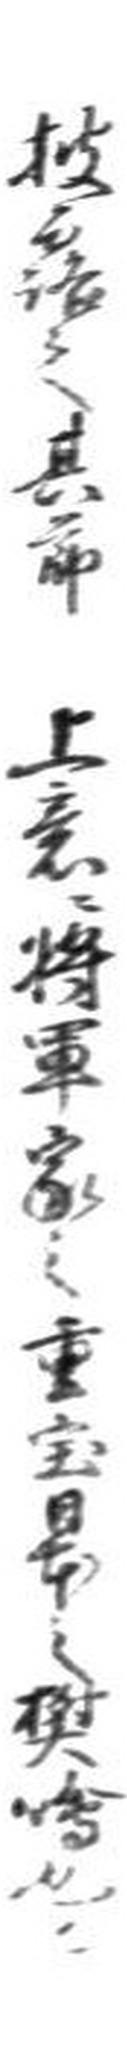披露之其節上意ニ将軍家之重宝日本之樊噲也と
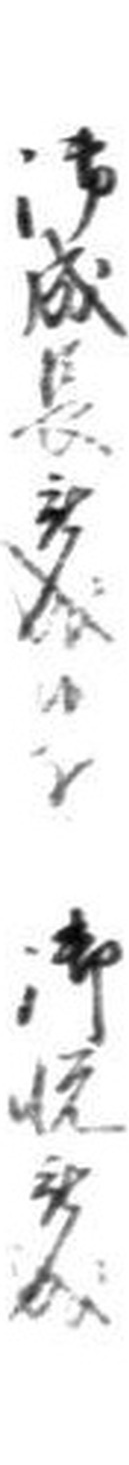御成長被成候を御悦被成
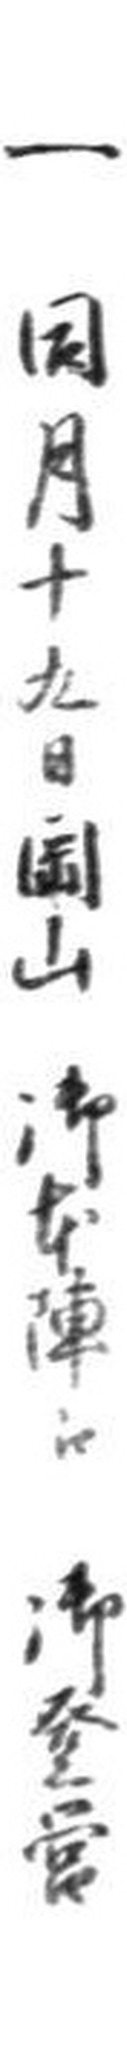一同月十九日岡山御本陣江御登営
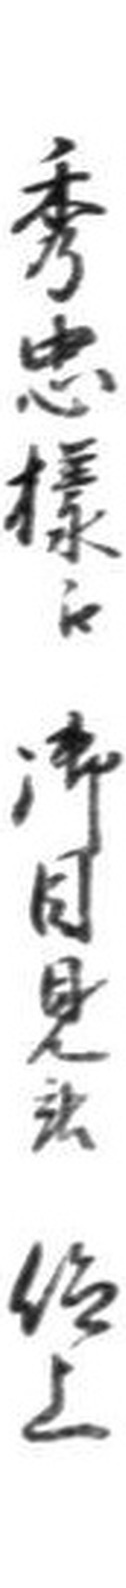秀忠様江御目見被仰上

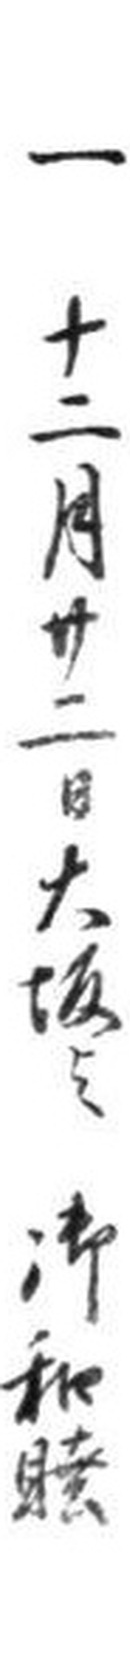一十二月廿二日大坂与御和睦
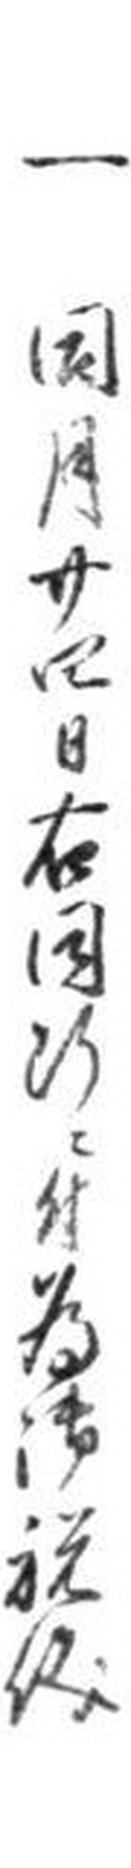一同月廿四日右同断ニ付為御祝儀
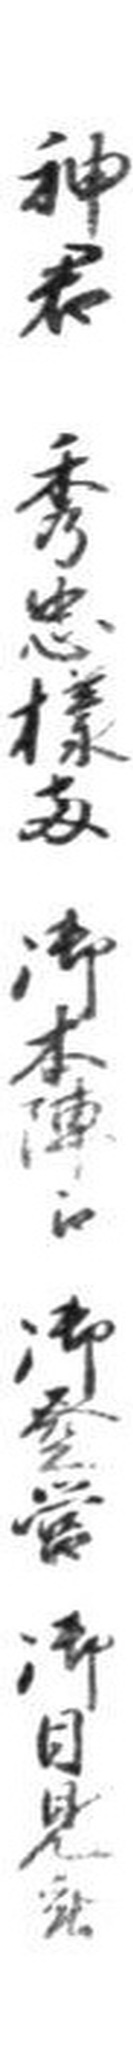神君秀忠様両御本陣江御登営御目見被
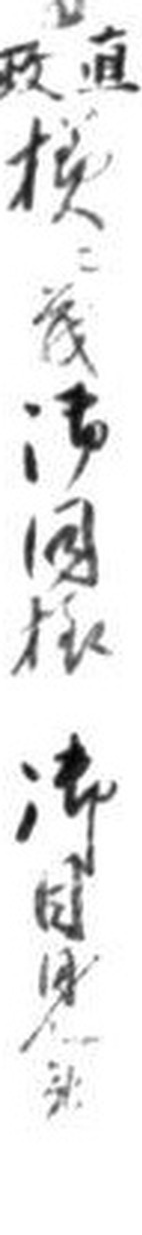政様ニ茂御同様御目見被
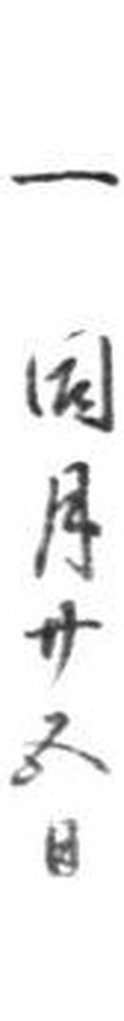一同月廿五日
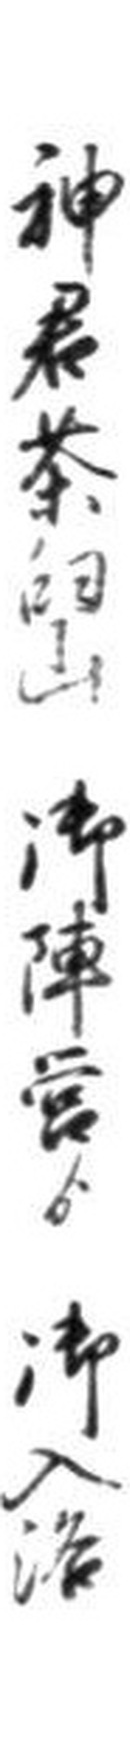神君茶臼山御陣営ゟ御入洛
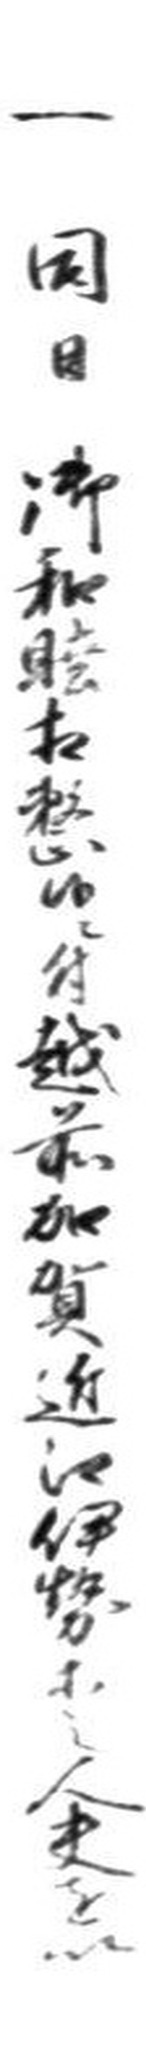一同日御和睦相整候ニ付越前加賀近江伊勢等之人夫を以
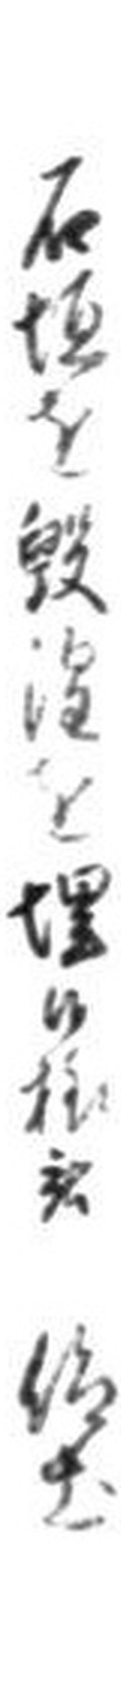石垣を毀湟を埋候様被仰出
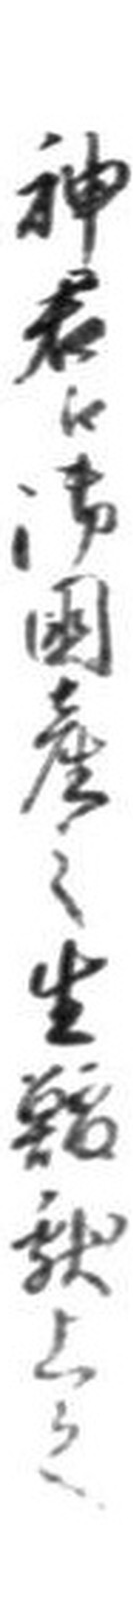神君江御国産之生鱈献上之

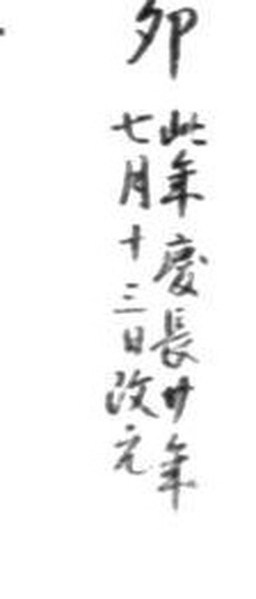七月十三日改元
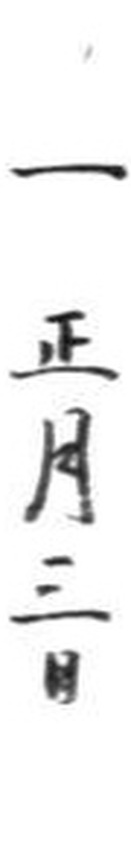一正月三日
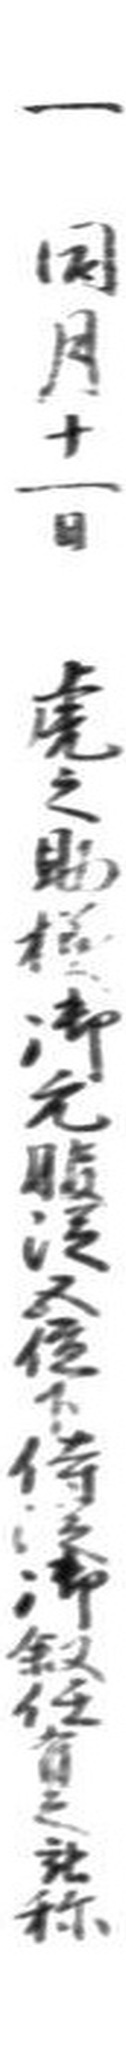一同月十一日虎之助様御元服従五位下侍従御叙任有之被称
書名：家譜 二 忠直公 従文禄四年到慶安四年
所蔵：福井県文書館 Fukui Prefectural Archives
